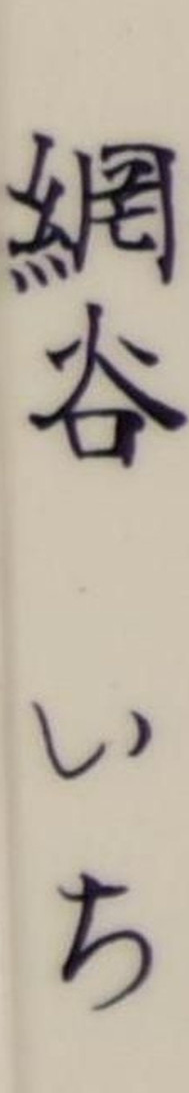網谷いち

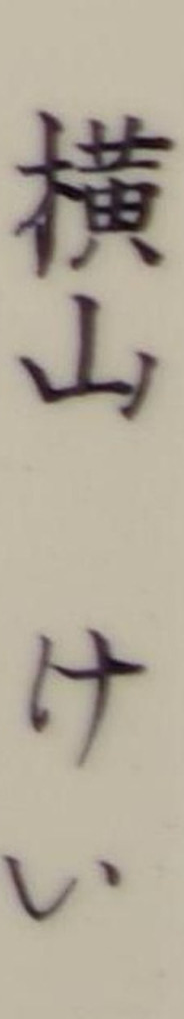横山けい
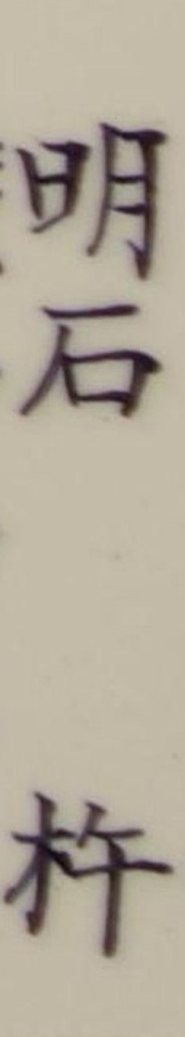明石杵
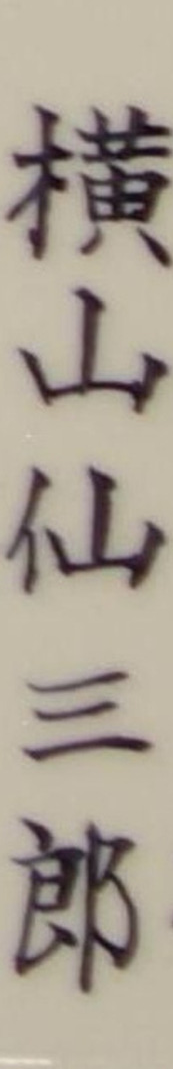横山仙三郎
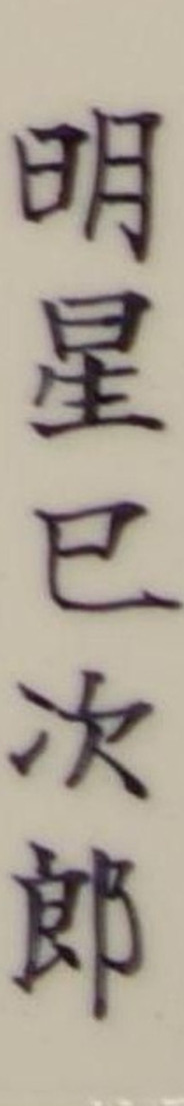明星巳次郎
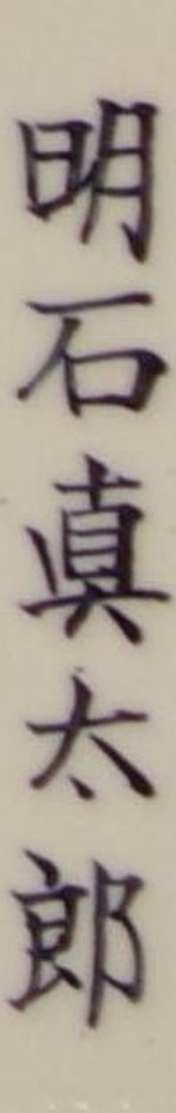明石真太郎
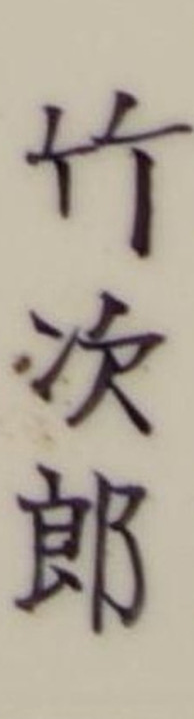竹次郎
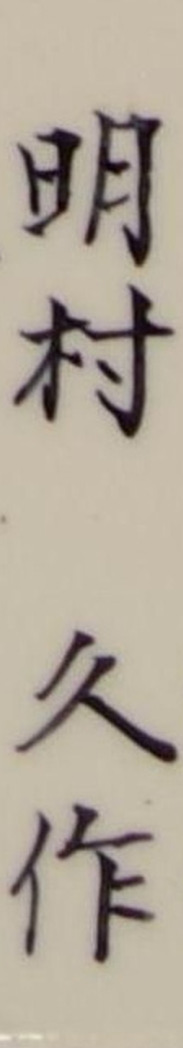明村久作
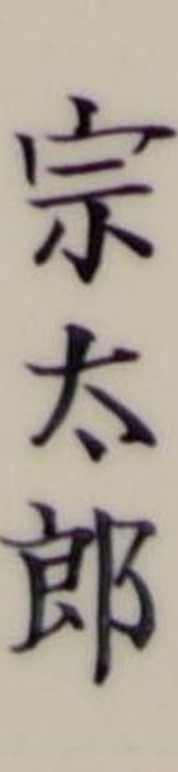宗太郎
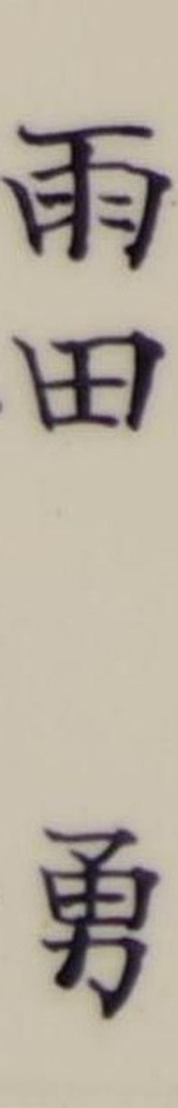雨田勇
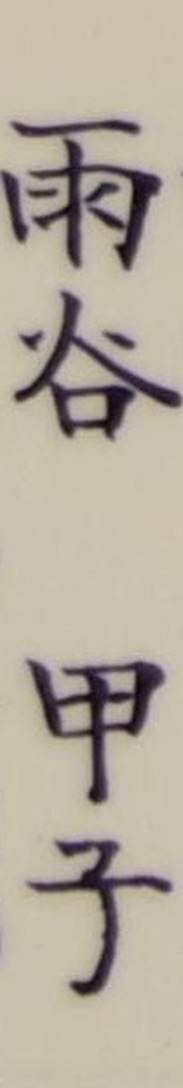雨谷甲子
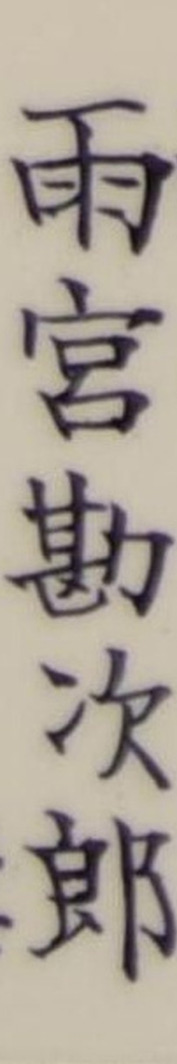雨宮勘次郎

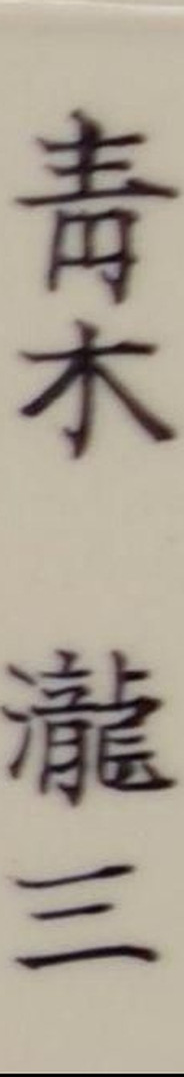青木瀧三
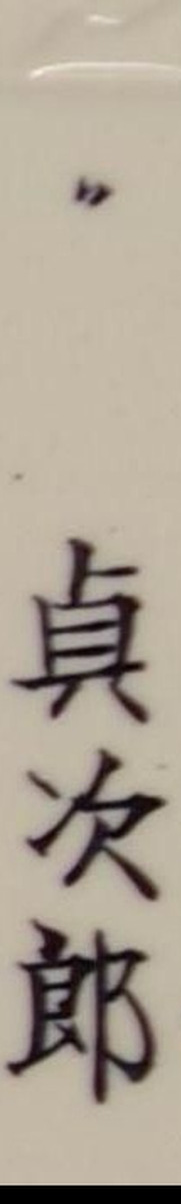貞次郎
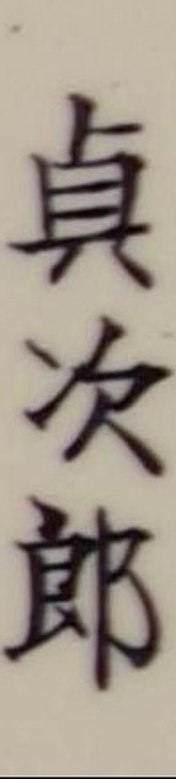貞次郎
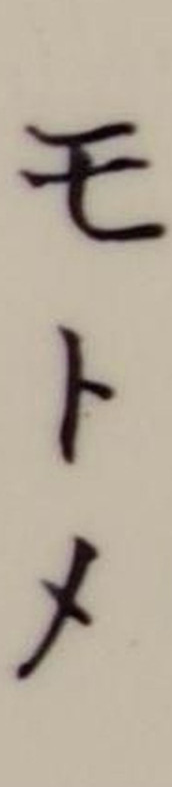モトメ
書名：E~L
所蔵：高野山金剛峯寺
